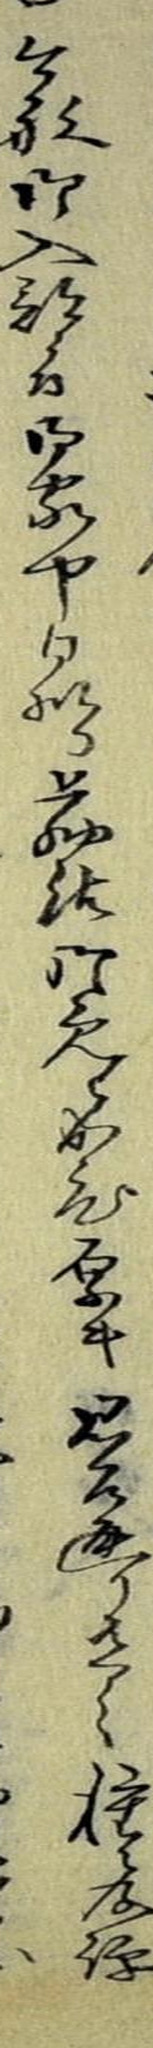○今般御入部に付御家中日掛り上納銀御免被成度厚キ思召通り有之種々及評
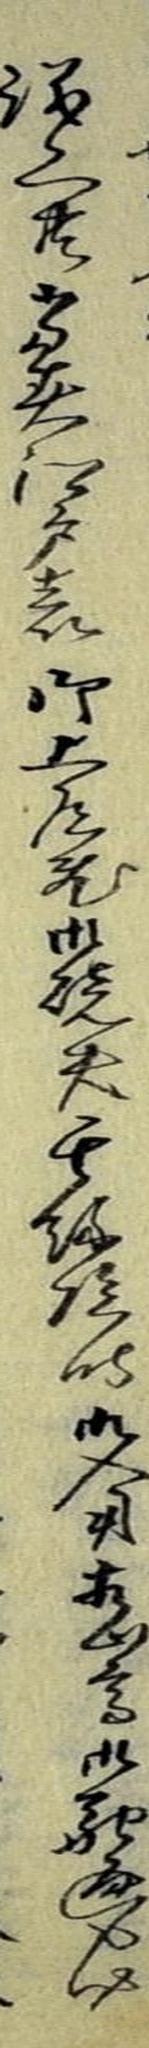議候へ共当春江戸表御上屋敷御焼失其餘臨時御入用相嵩御融通も必
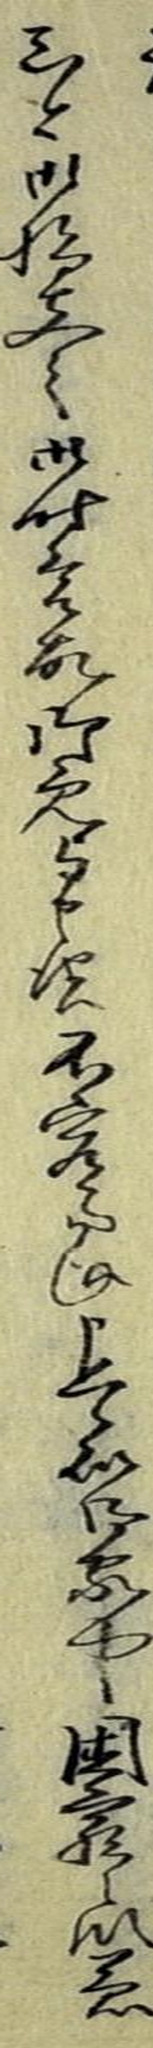至と御指支之御時節故御免と申儀は不容易趣申上候処御家中困窮之段兼
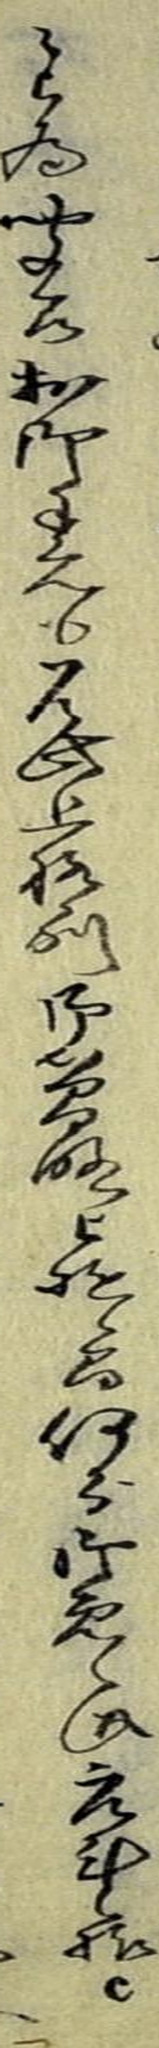々被為聞召於御手元も乍此上格別御簡略被遊候間何分御免候趣取斗候様被
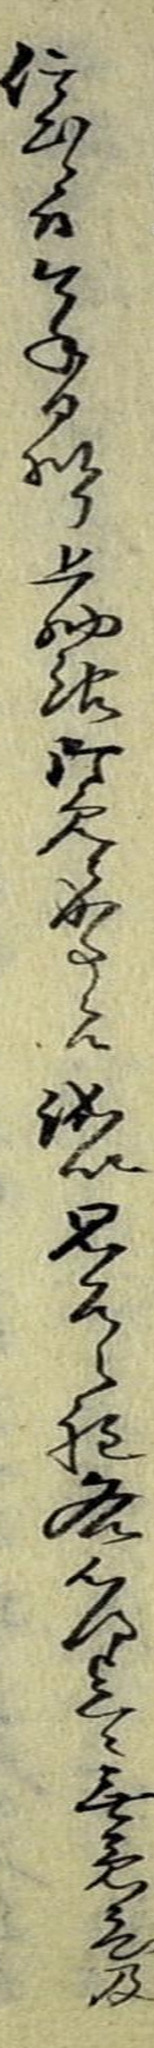仰出候に付今年日掛り上納銀御免被成事に候誠以思召之程各心得迄に無急度及
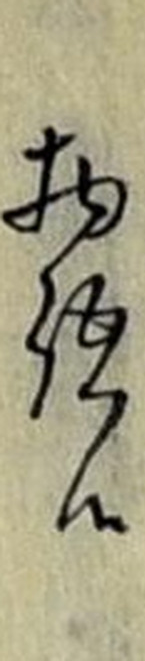物語候
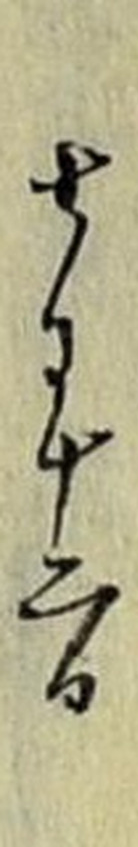七月十二日
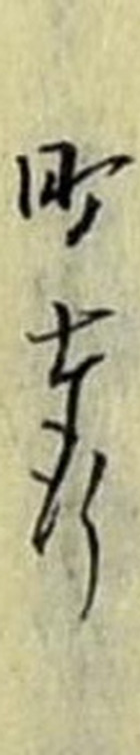町奉行
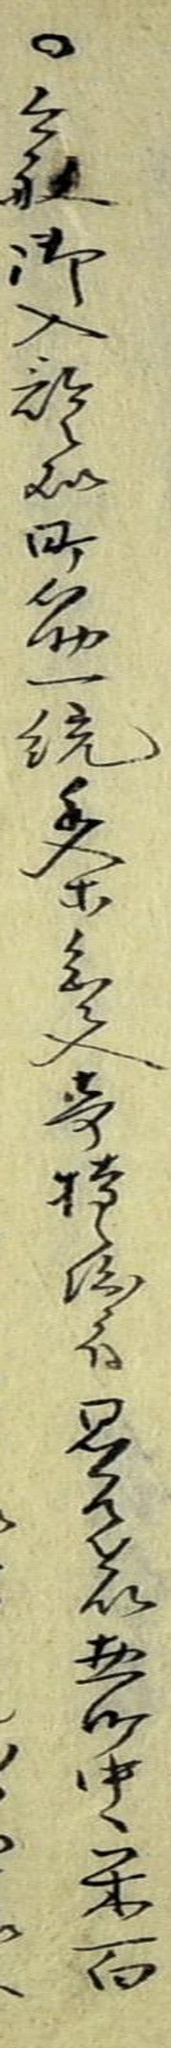○今般御入部之処町筋一統手入等念に入奇特之議に付思召を以惣町中へ米百
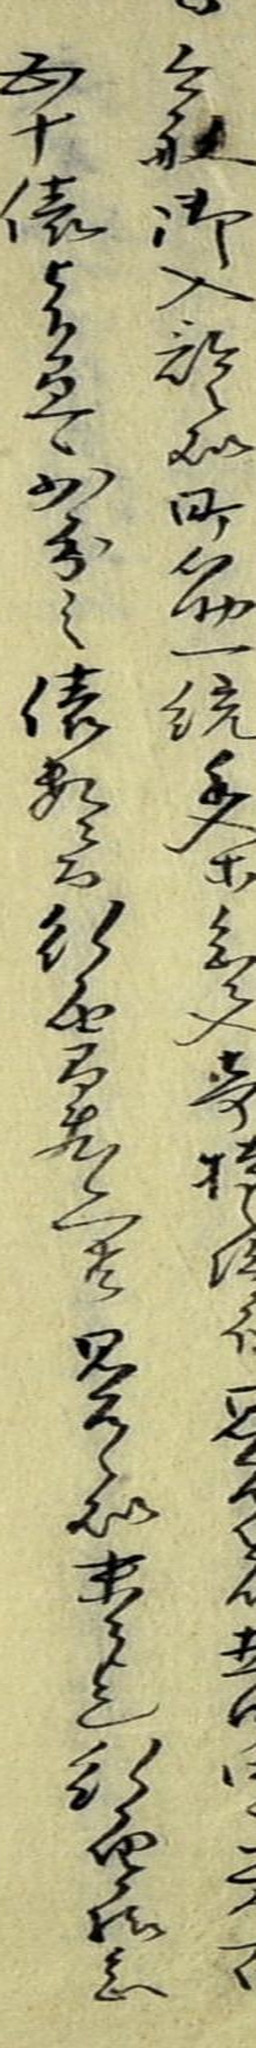五十俵被下置候少分之俵数に而行届間敷候へ共思召之処末々迄行届候様念

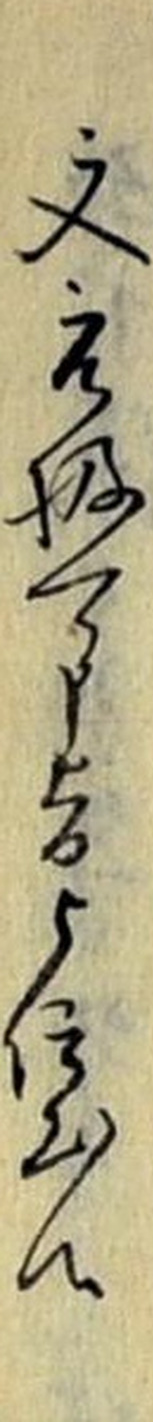に入取扱可申旨被仰出候
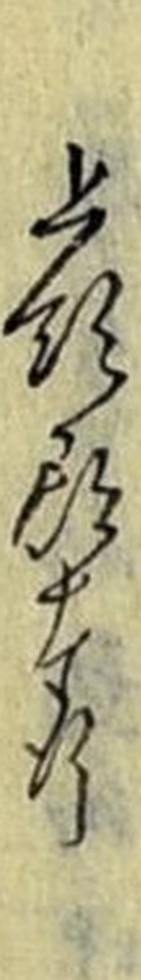上領郡奉行
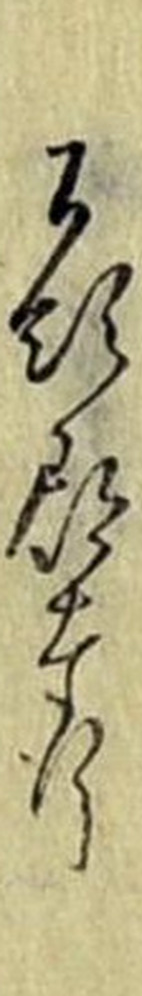上領郡奉行
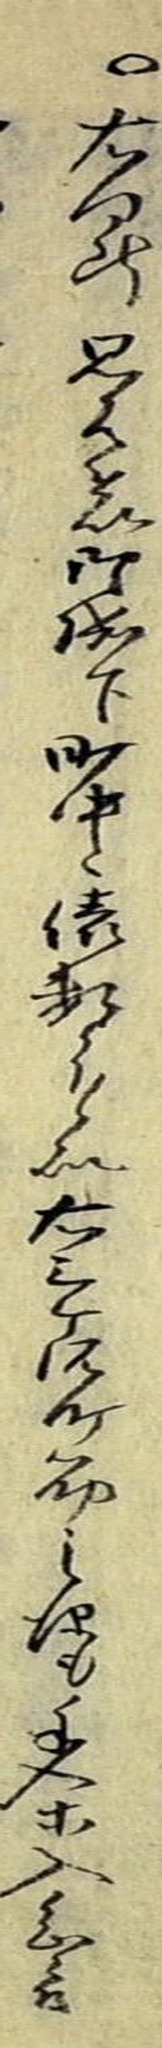○右同断思召を以御城下町中へ俵数被下候処右三ヶ所町筋之儀も手入等入念に付
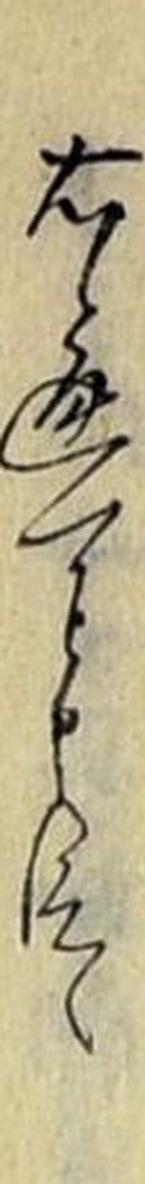右之通可被申渡候
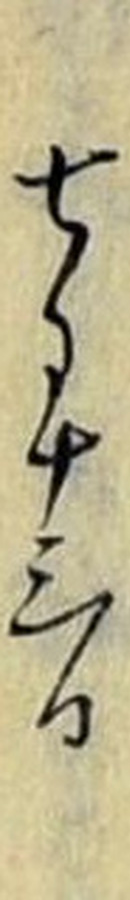七月十三日
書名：命令之部 六
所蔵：福井県文書館 Fukui Prefectural Archives
